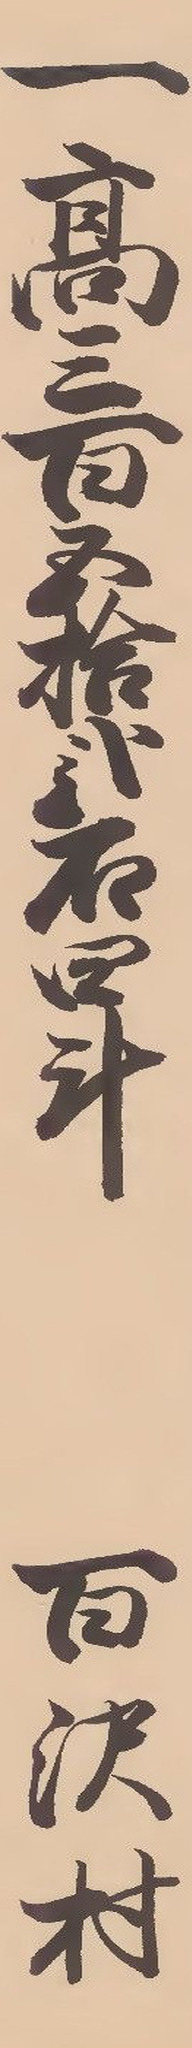一高三百五拾弐石四斗百沢村
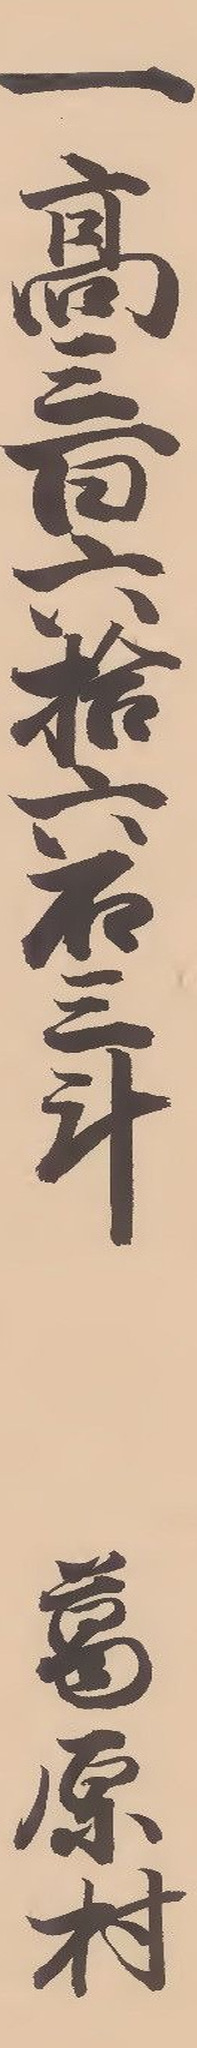一高三百六拾六石三斗葛原村
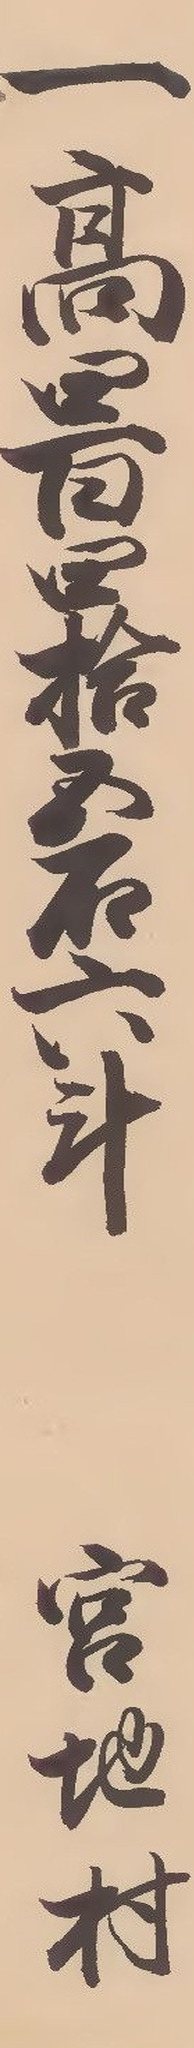一高四百四拾五石六斗宮地村

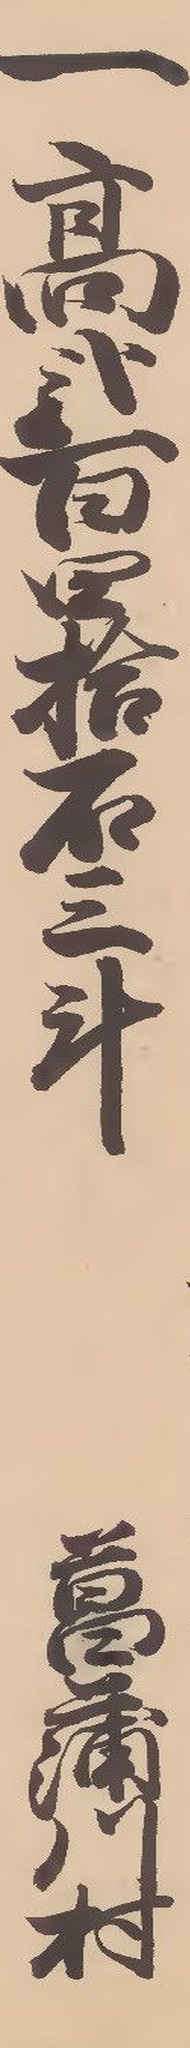一高弐百四拾石三斗菖蒲川村
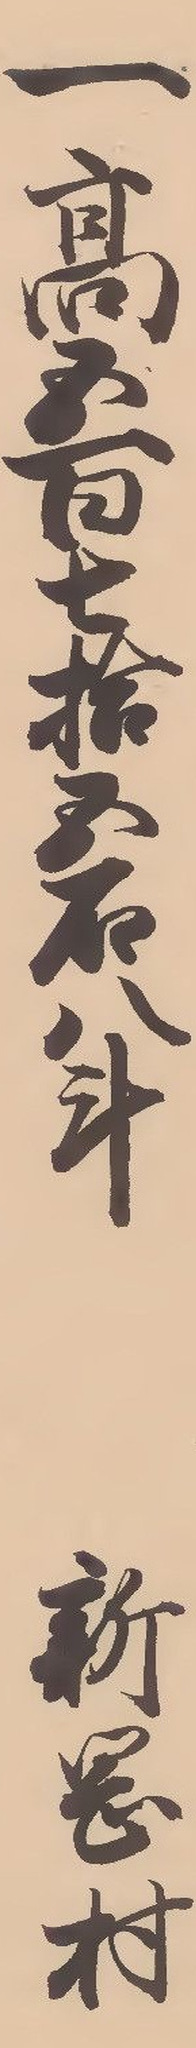一高五百七拾五石八斗新岡村
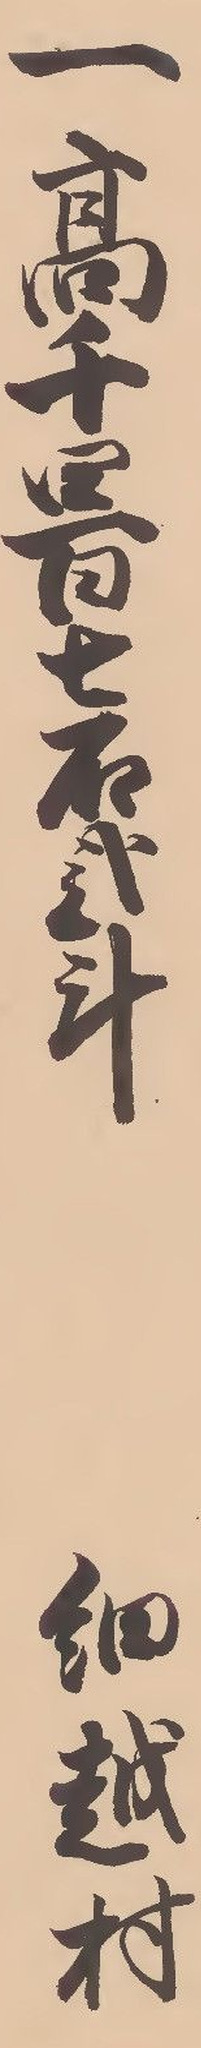一高千四百七石弐斗細越村
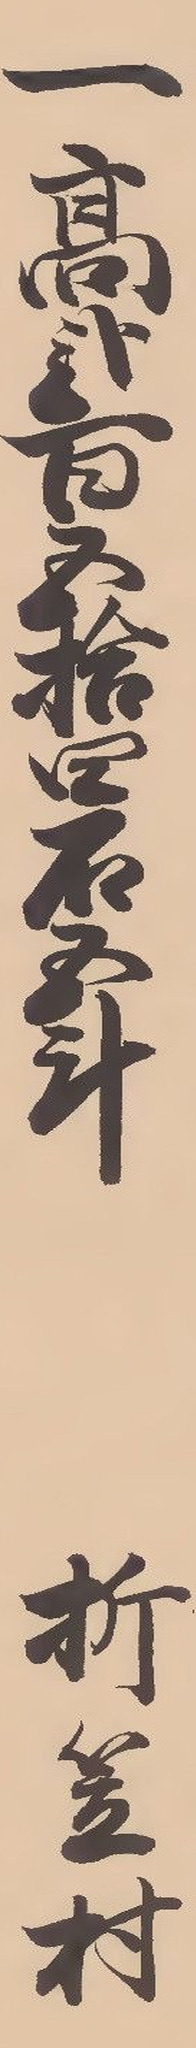一高弐百五拾四石五斗折笠村
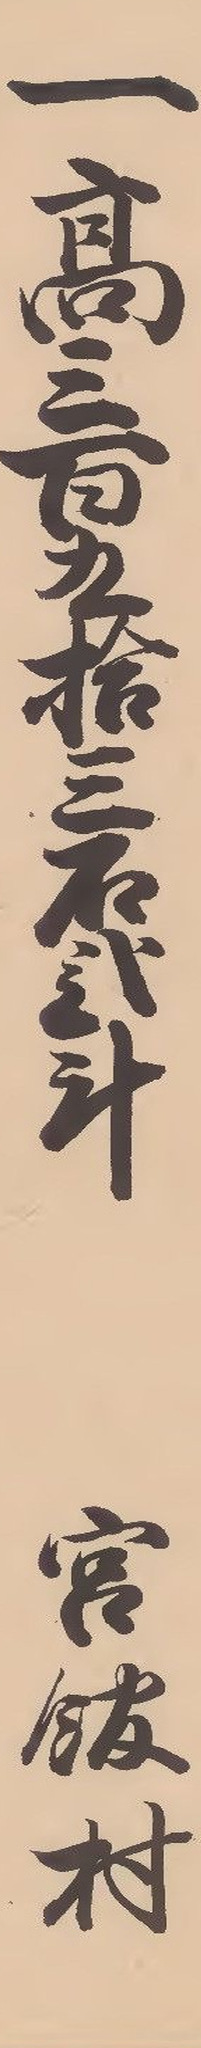一高三百九拾三石弐斗宮館村
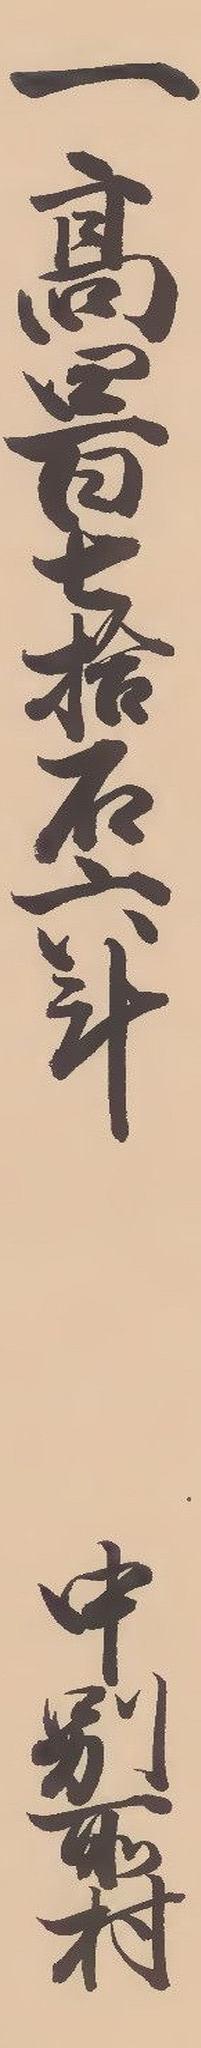一高四百七拾石六斗中別所村
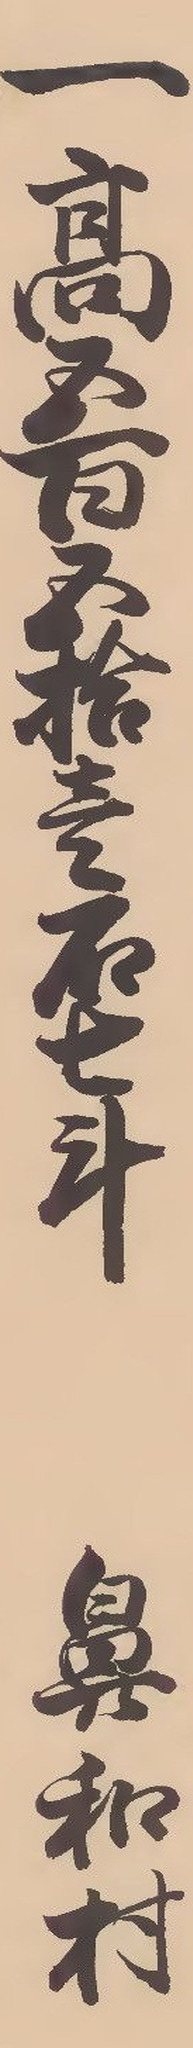一高五百五拾壱石七斗鼻和村

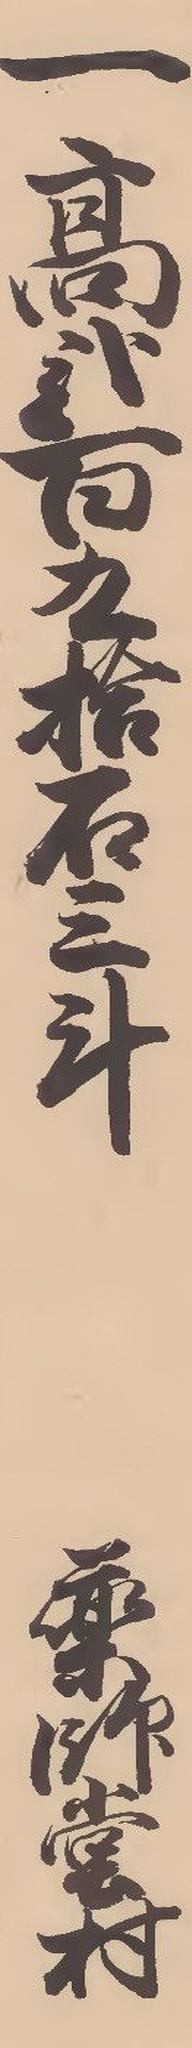一高弐百九拾石三斗薬師堂村
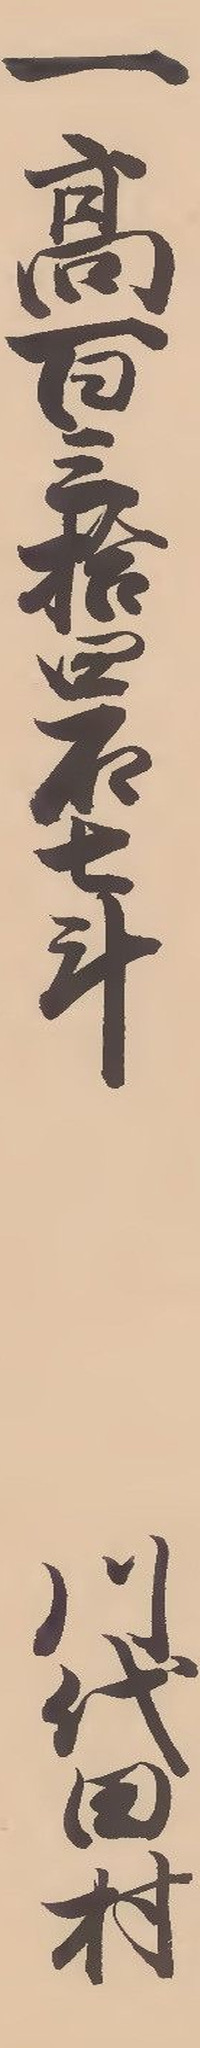一高百三拾四石七斗川代田村
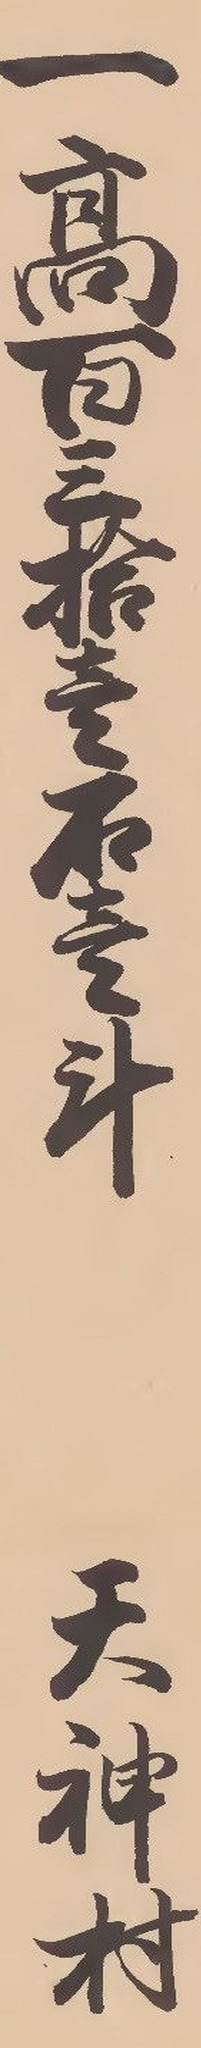一高百三拾壱石壱斗天神村
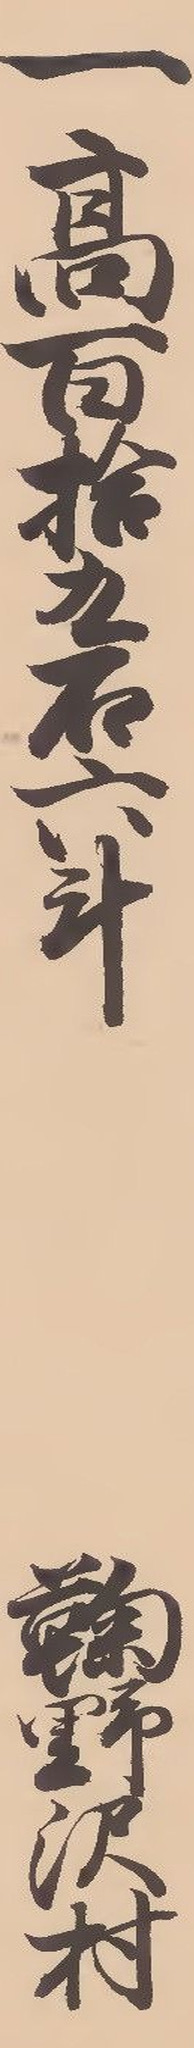一高百拾九石六斗鞠野沢村
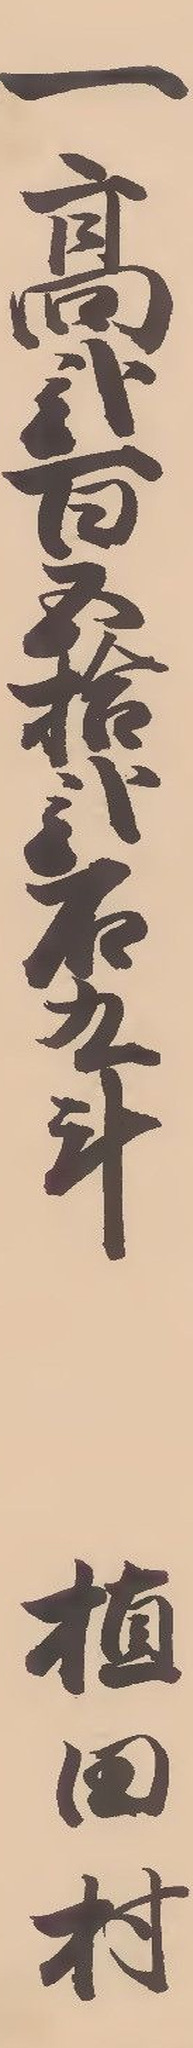一高弐百五拾弐石九斗植田村

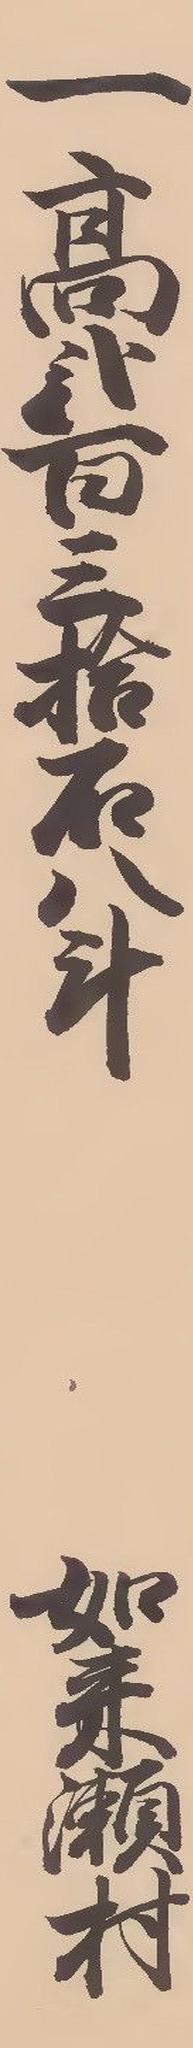一高弐百三拾石八斗如来瀬村
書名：陸奥国郷帳　７
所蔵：国立公文書館 National Archives of Japan
